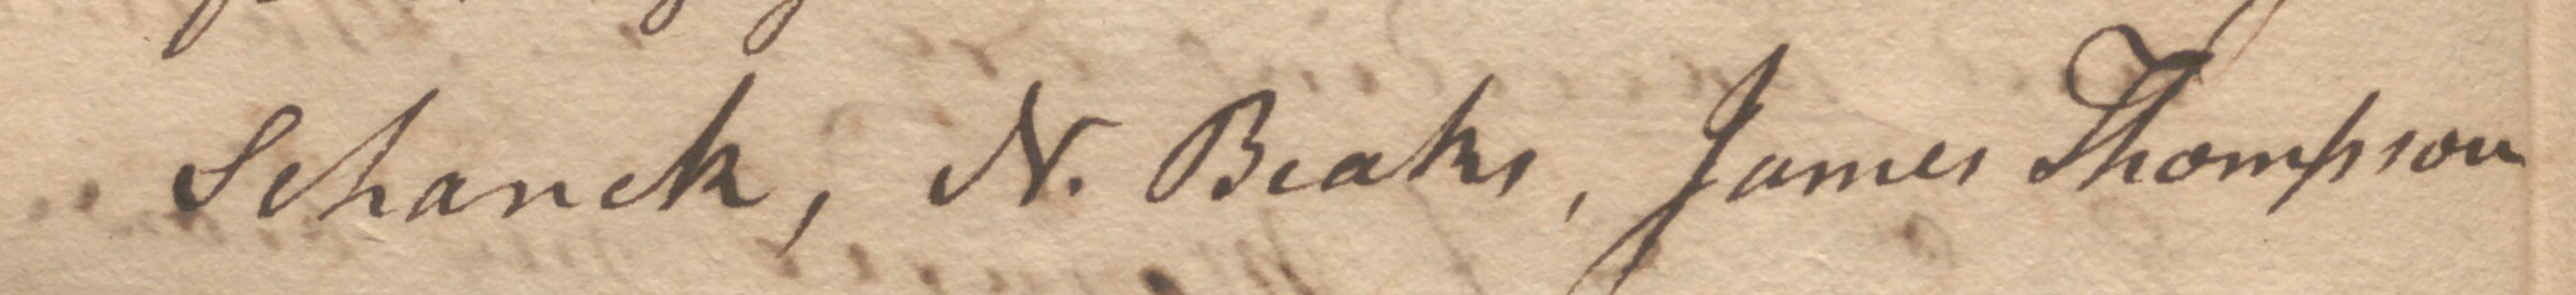Schanck, N. Beaks, James Thompson
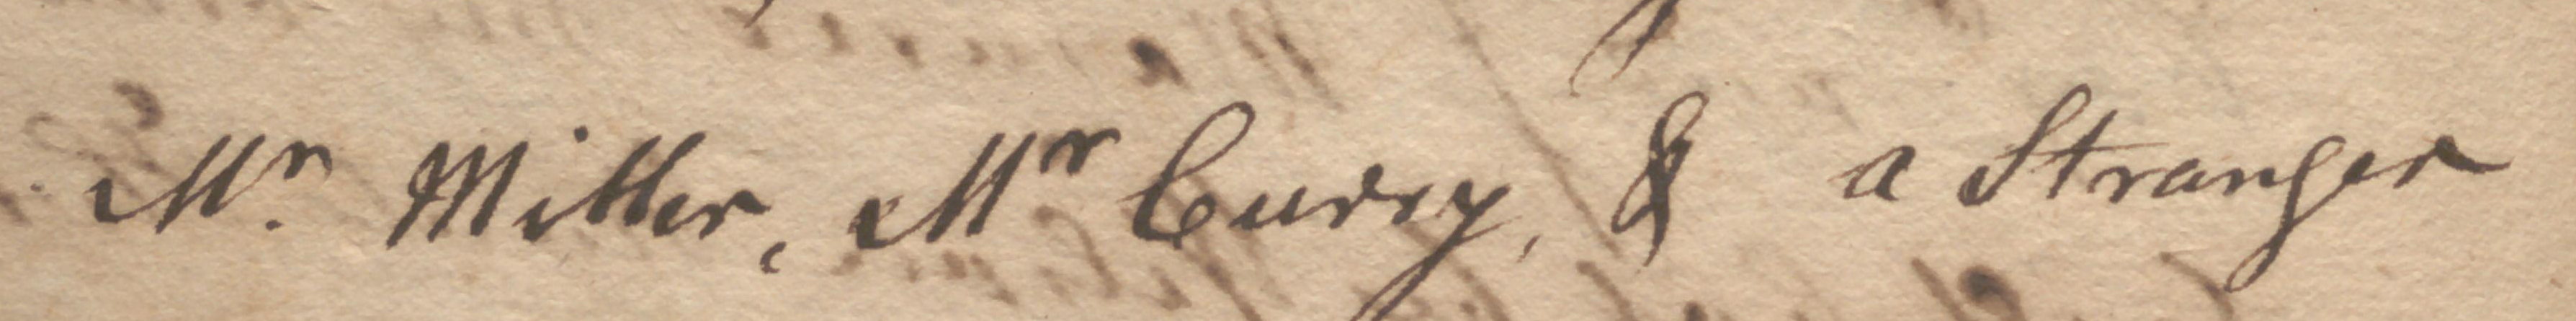M^r. Miller, M^r. Curry, & a Stranger
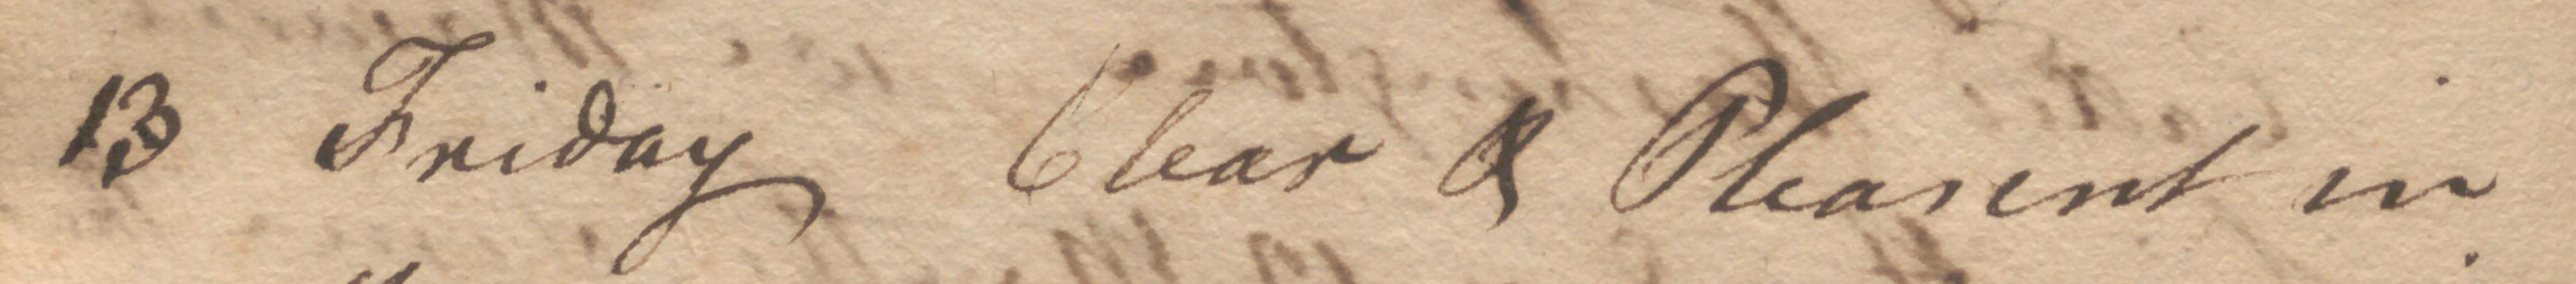13 Friday, Clear & Pleasent in
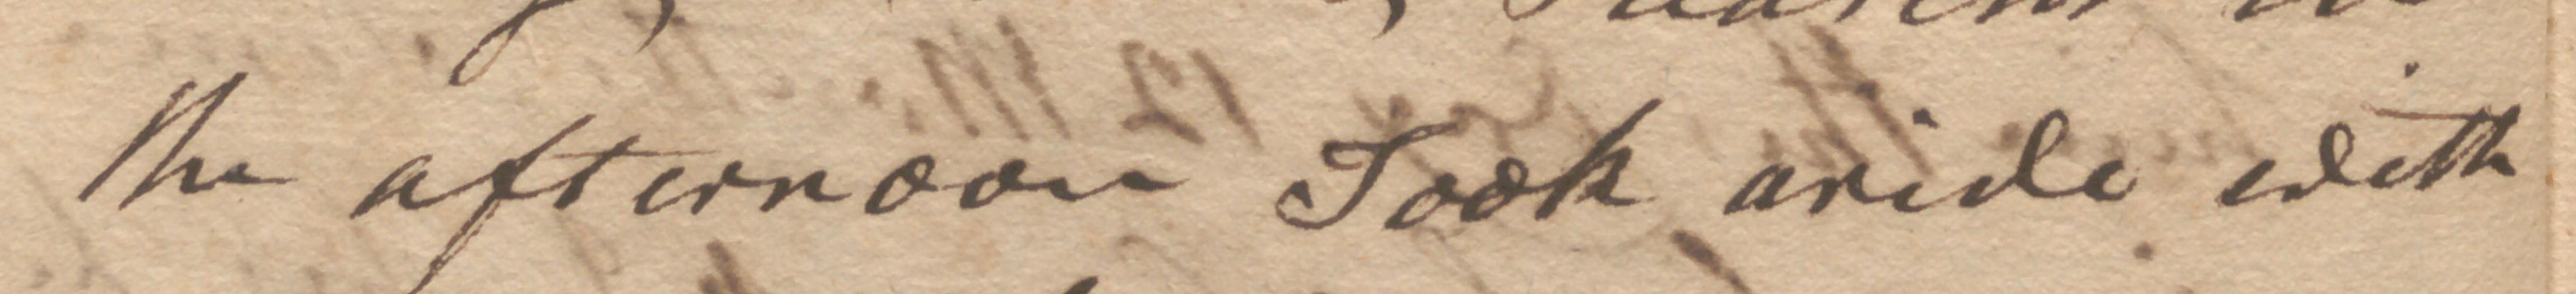the afternoon Took a ride with
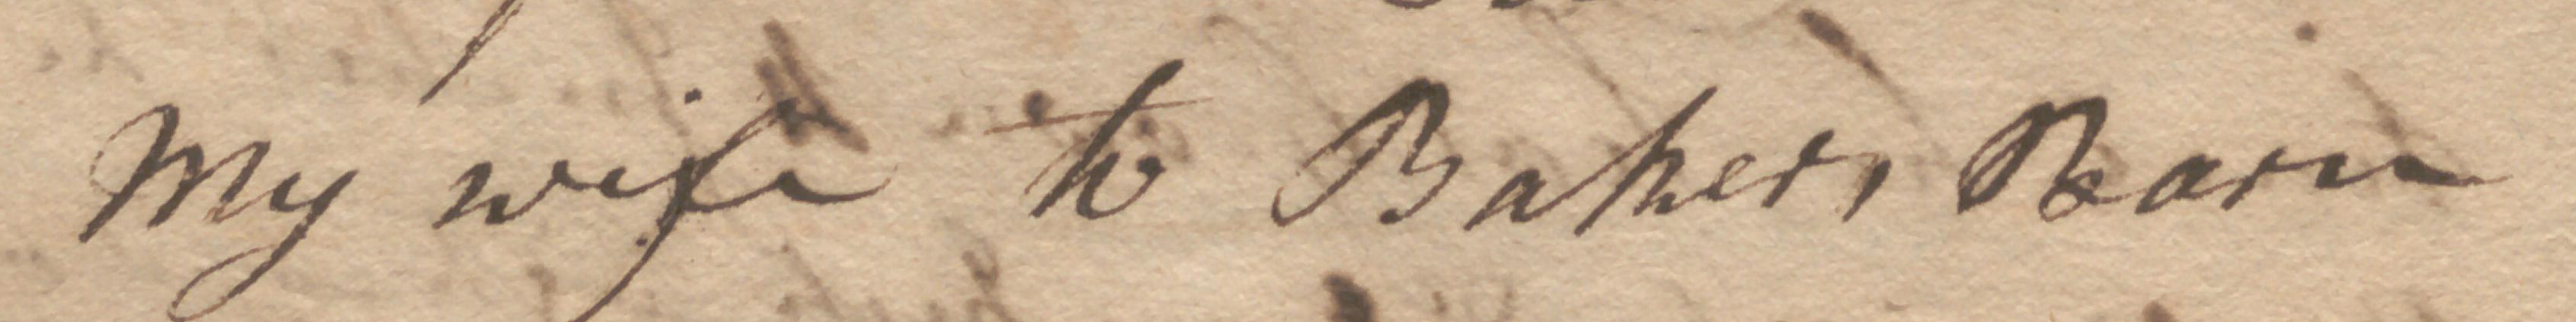My wife to Bakers Barn
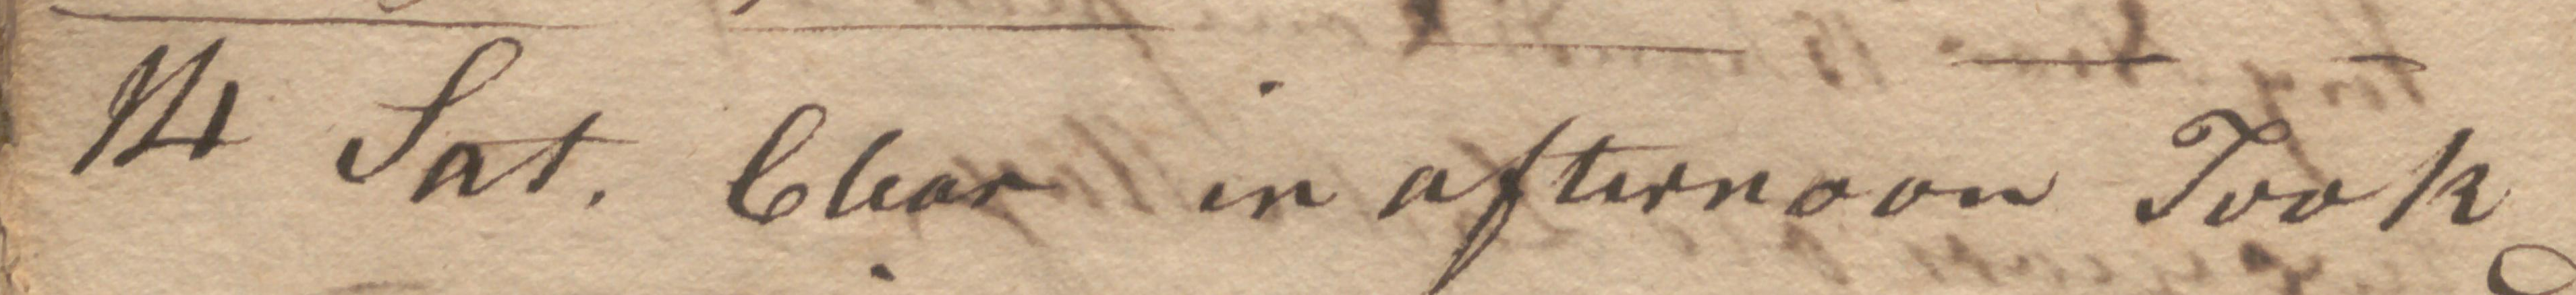14 Sat. Clear in afternoon Took
